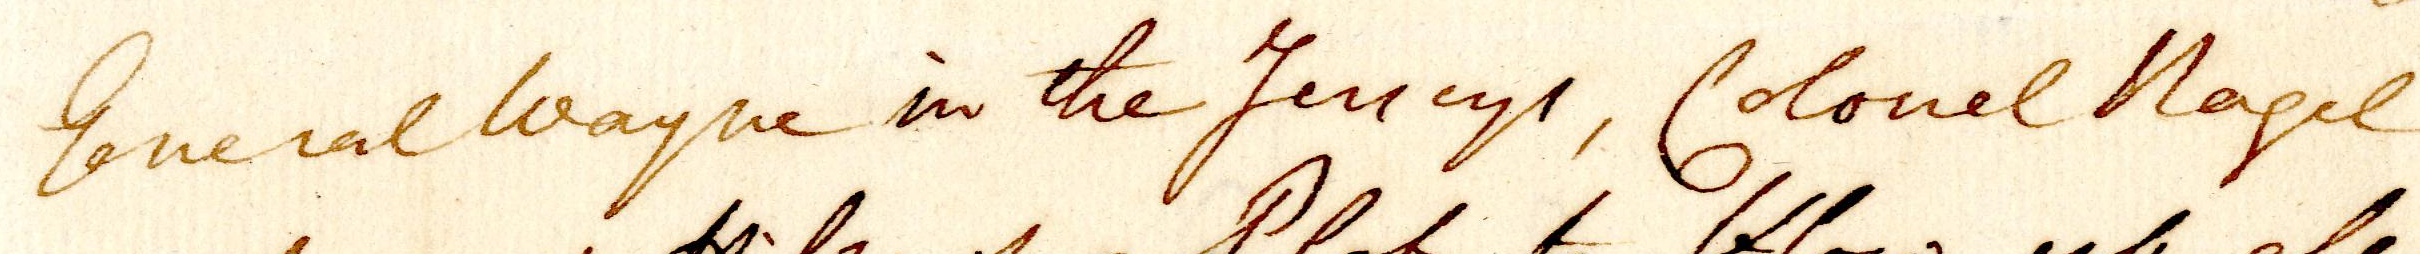General Wayne in the Jerseys, Colonel Nagel
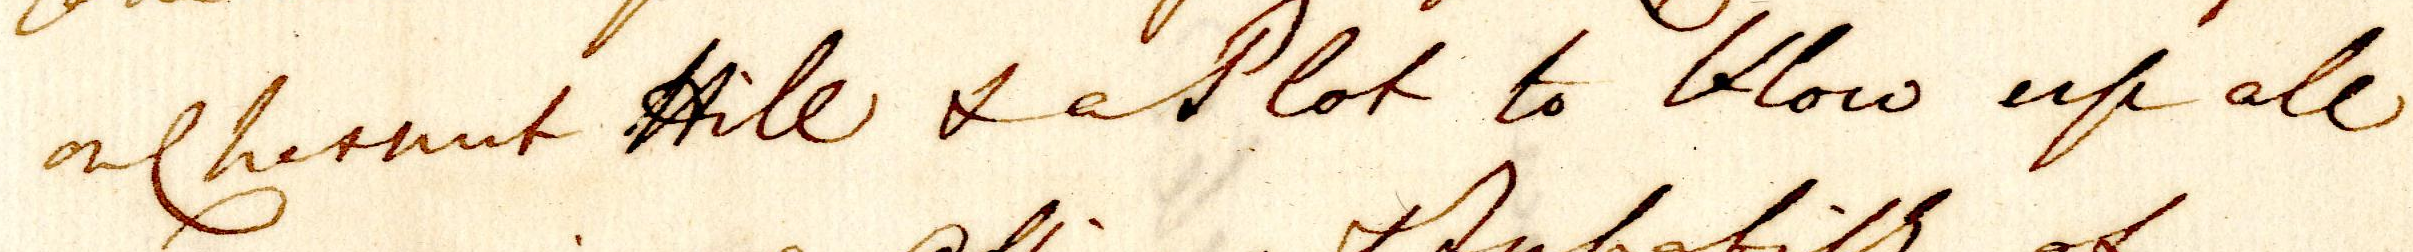or Chesnut Hill & a Plot to blow up all
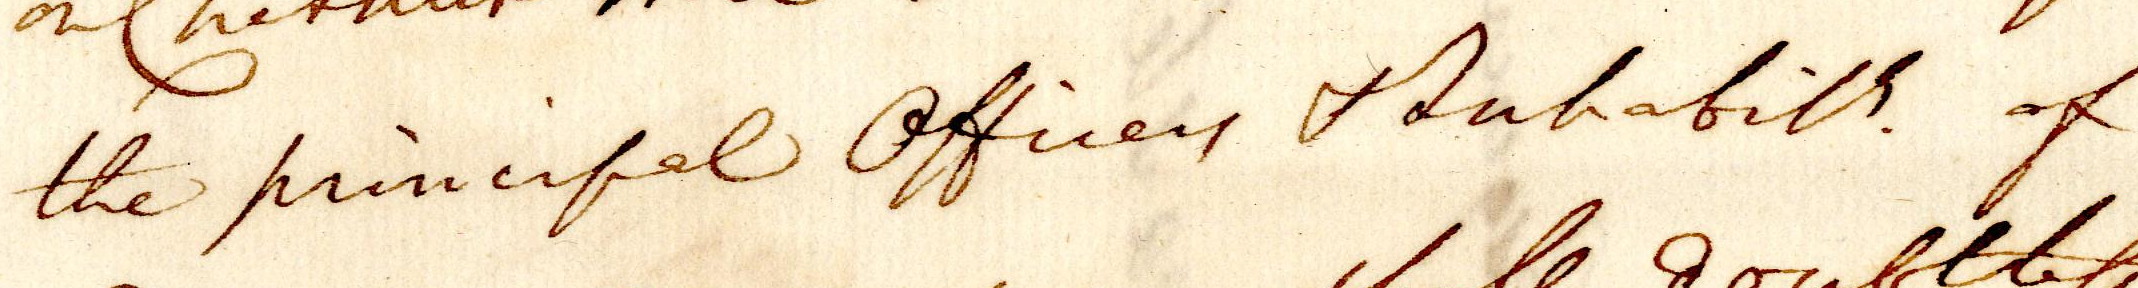the principal Officers & Inhabit^s. of
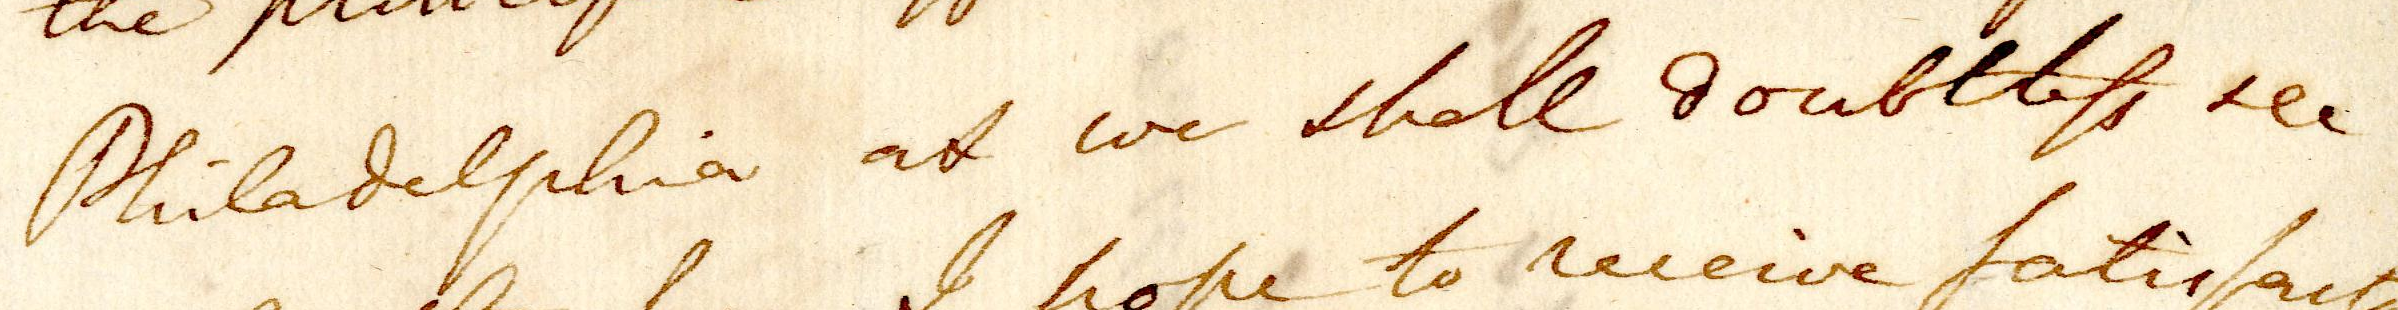Philadelphia at we shall doubtless see
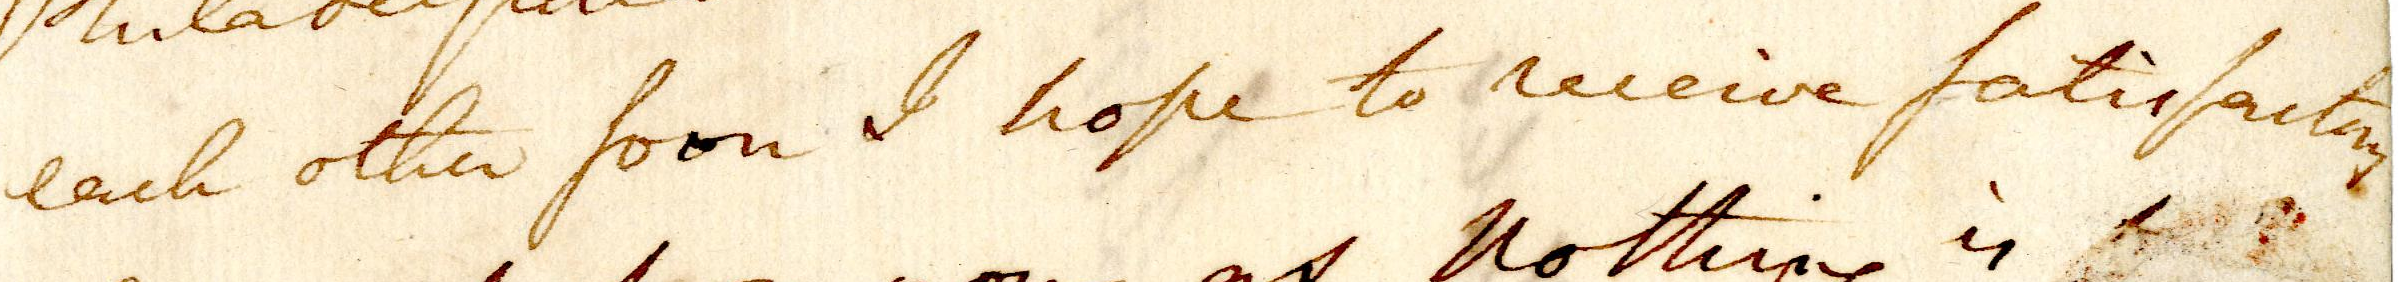each other I hope to receive satisfactory
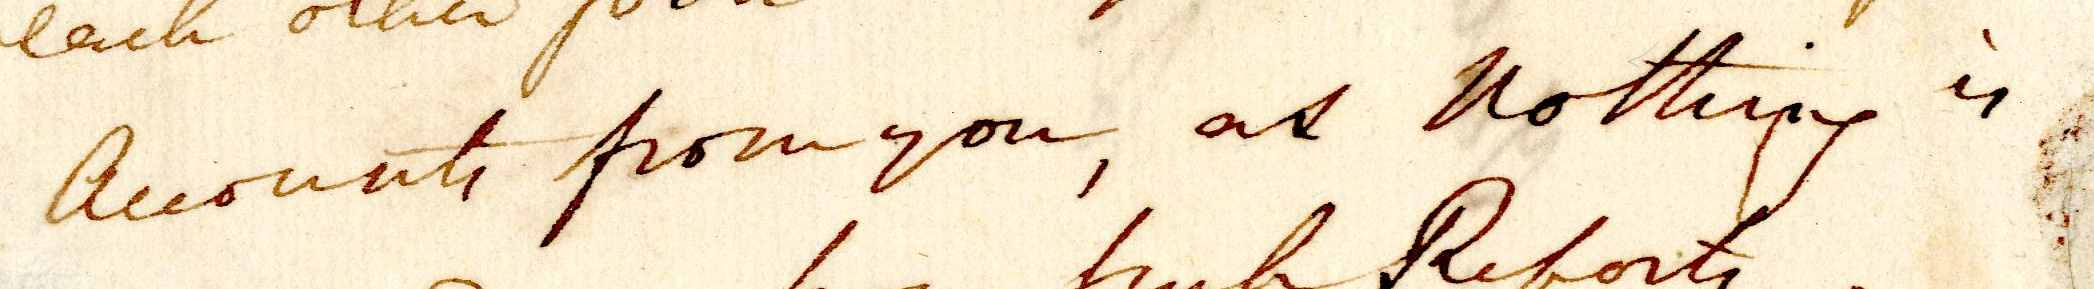Accounts from you, as Nothing is
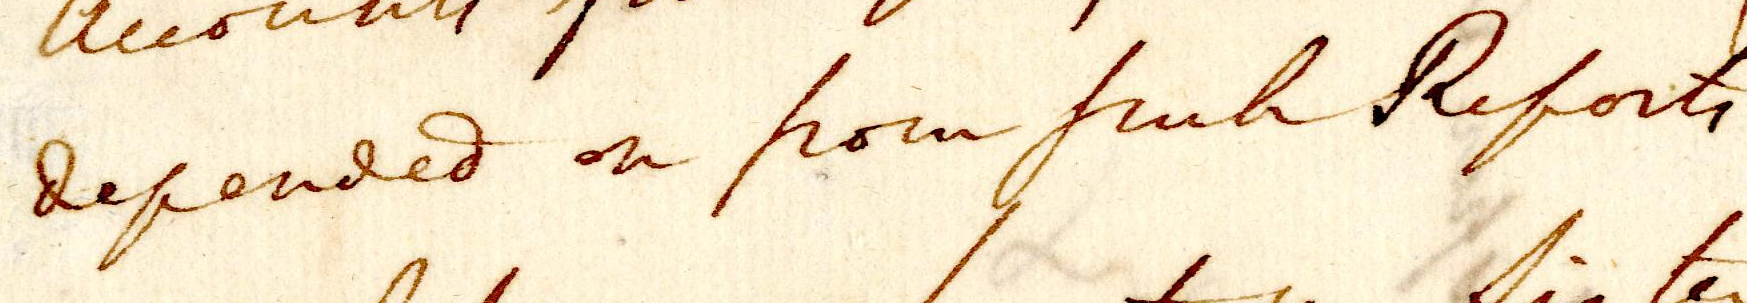depended on from such Reports
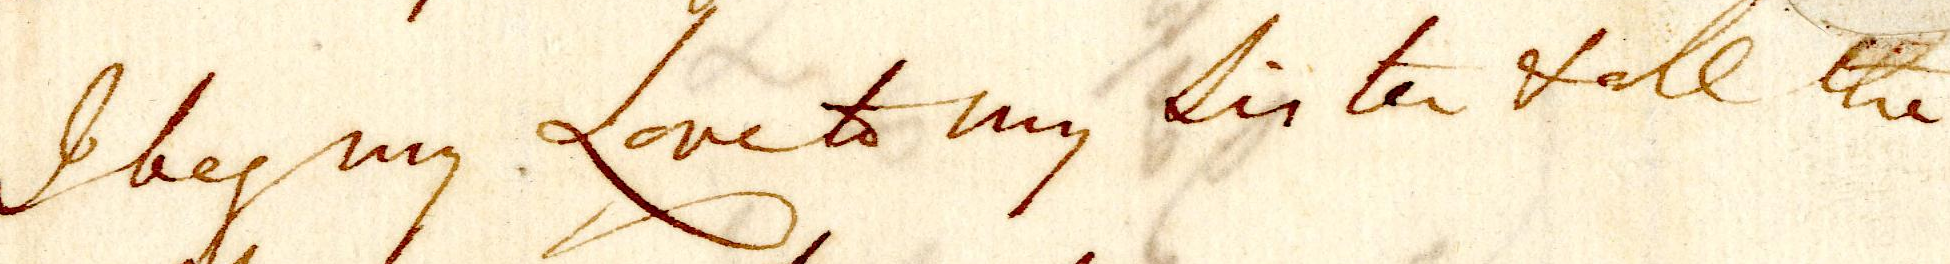I beg my Love to my Sister & all the
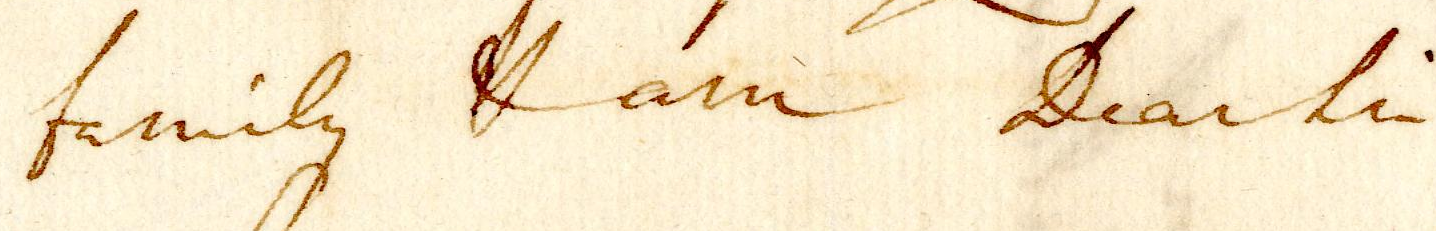family & am Dear Sir
